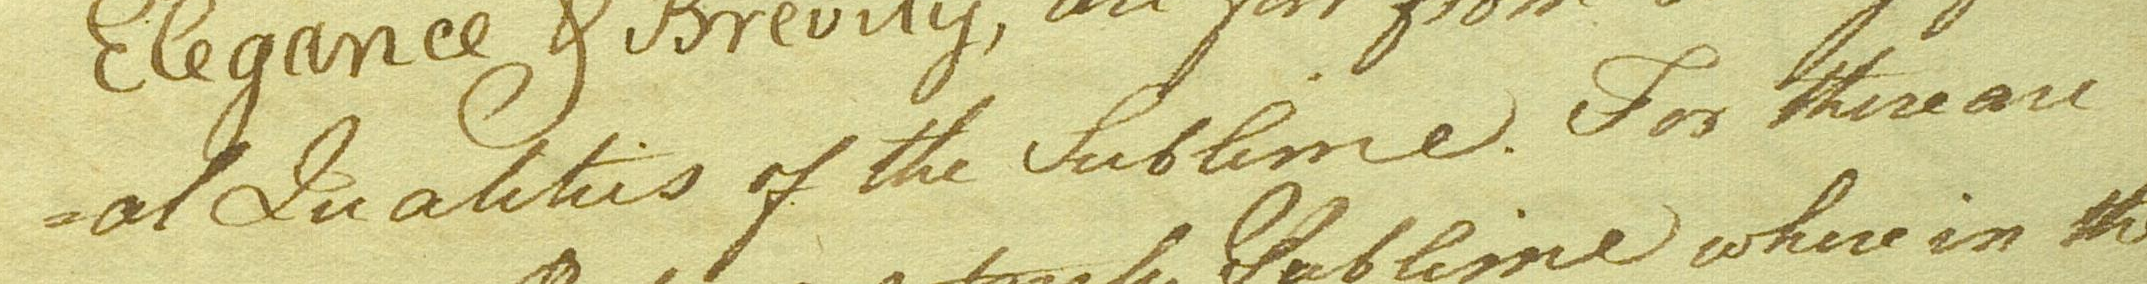-al Qualities of the Sublime. For there are
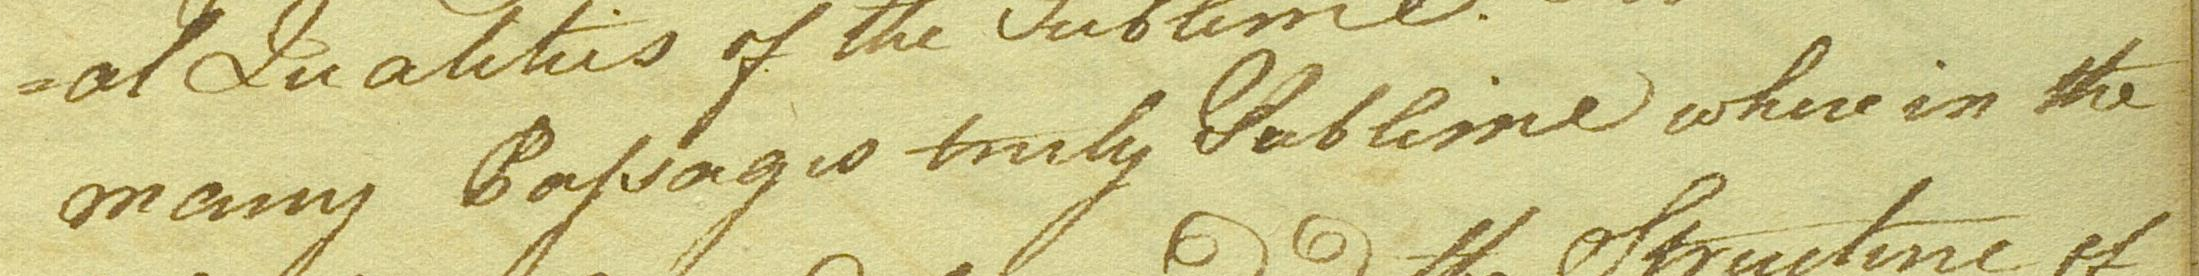many Passages truly Sublime where in the
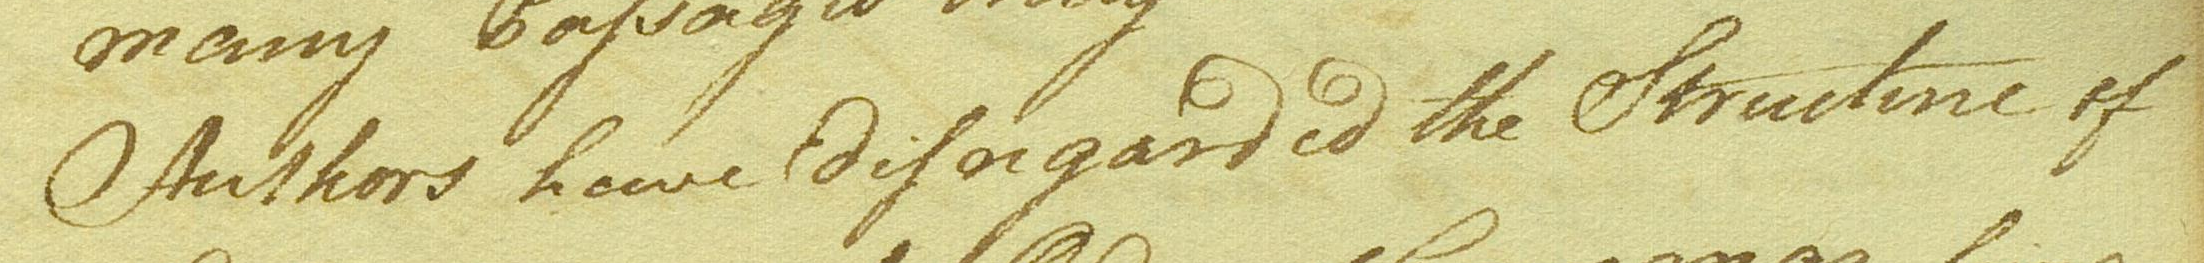Authors have disregarded the Structure of
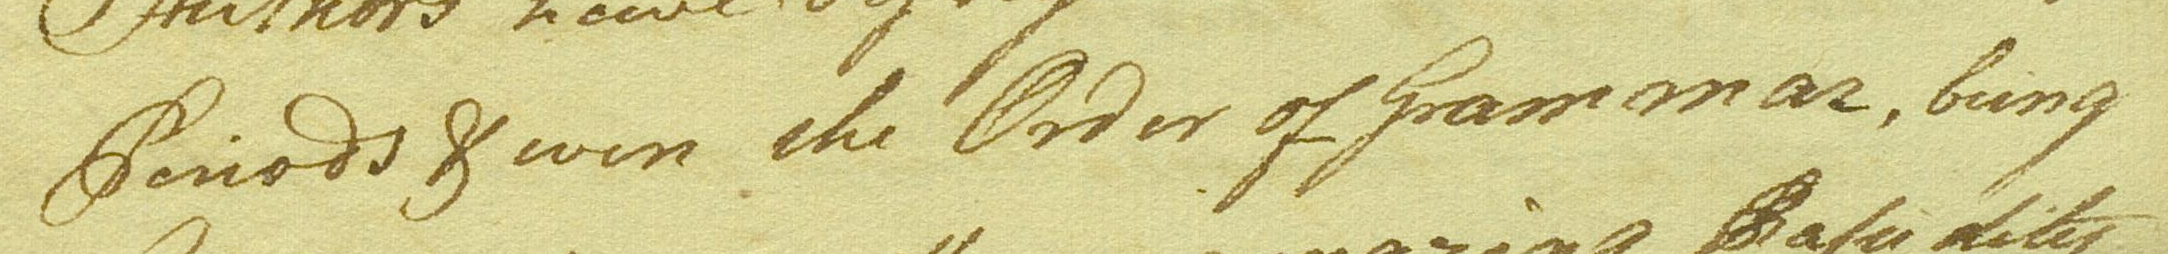Periods & even the Order of Grammar, being
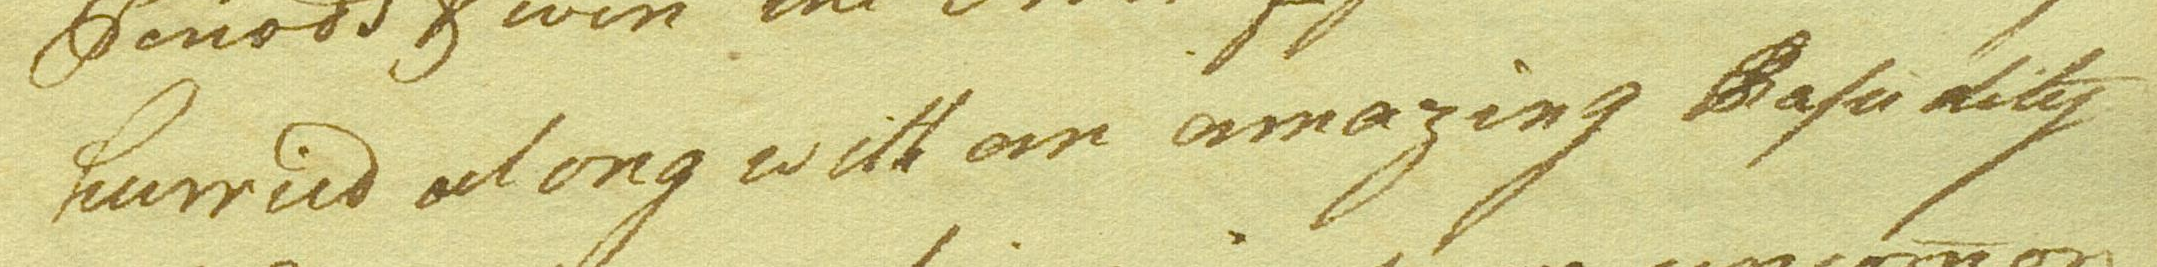hurried along with our amazing [_]asudity
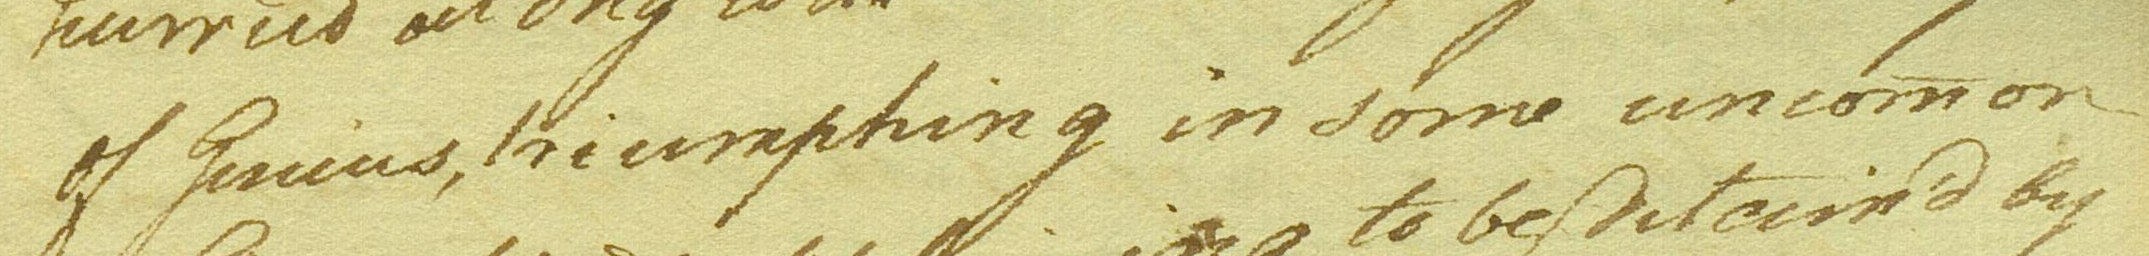of Genius, triumphing in some uncom̄on
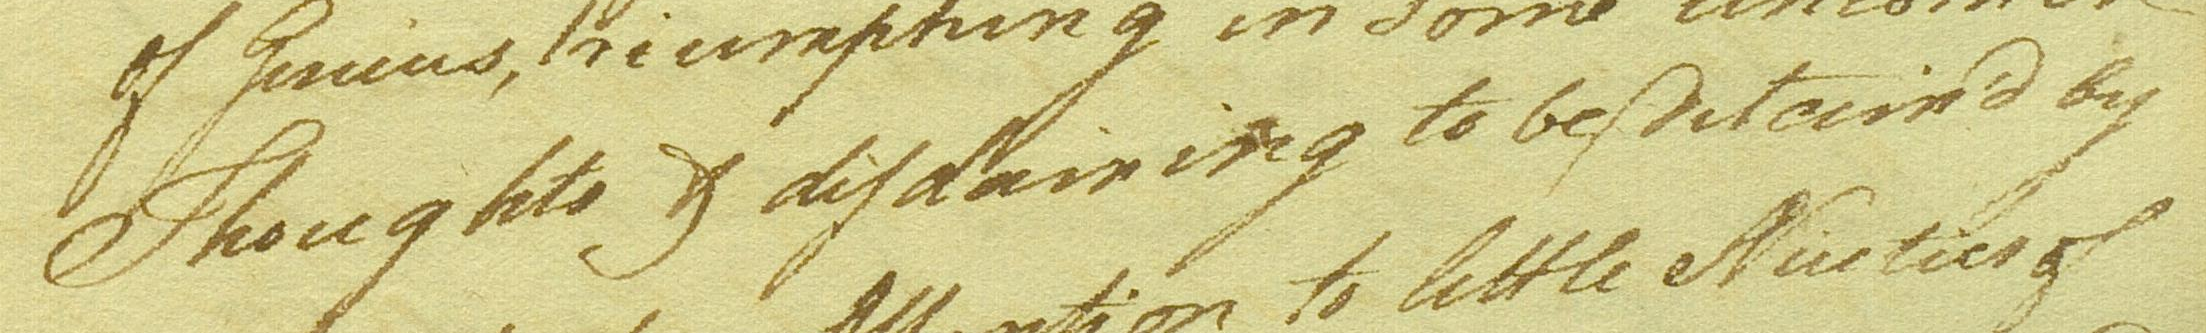Thoughts & disdaining to be detain'd by
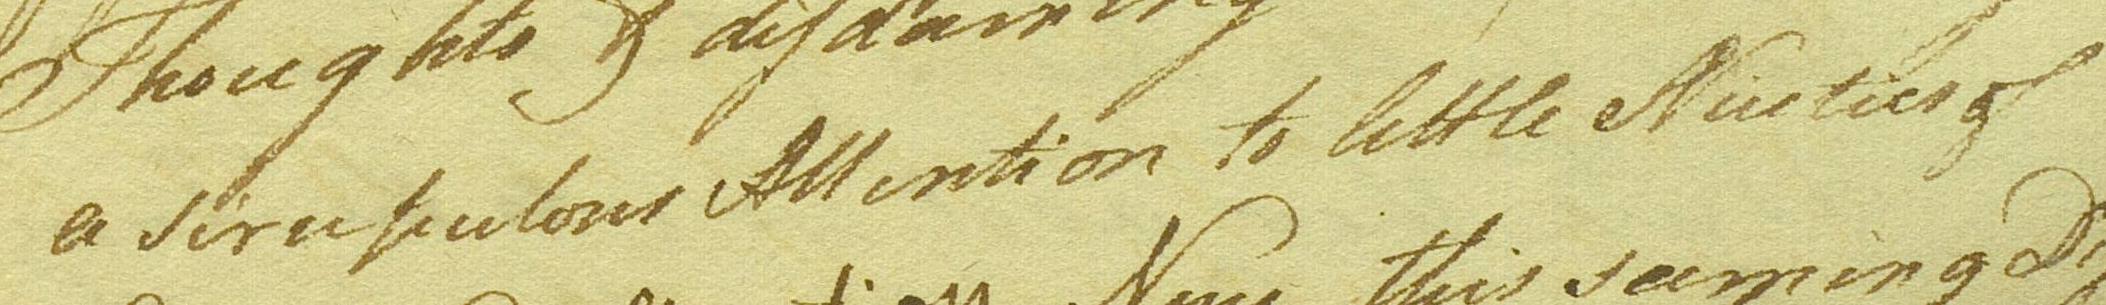a scrupulous Attention to little Niceties of
